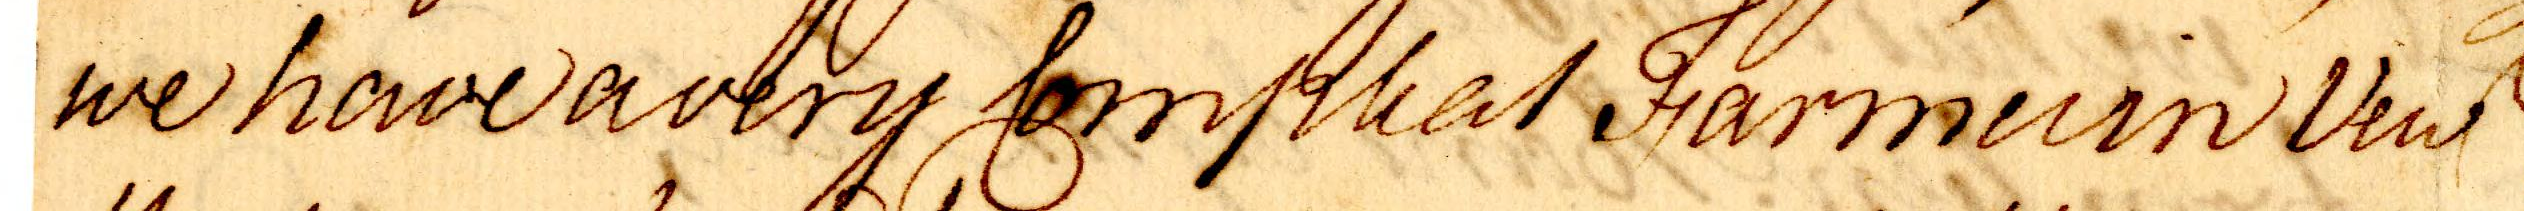we have a very Compleat Farmer in Vew
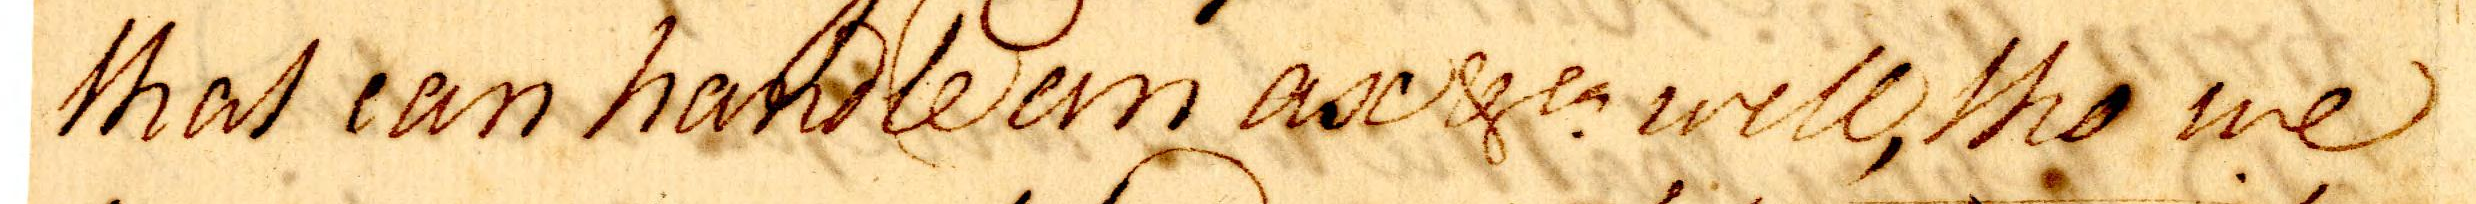that can handle em asc&c. well, tho we
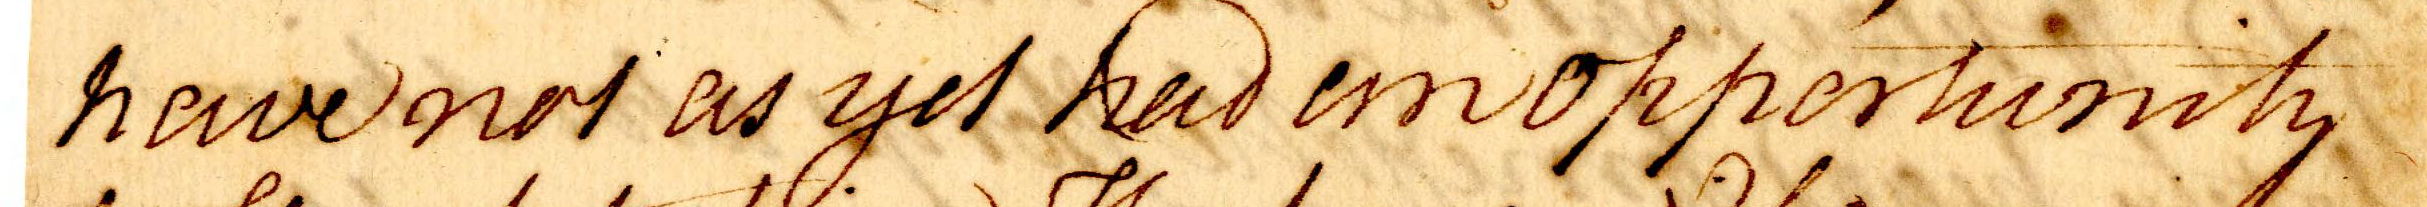have not as yet had an opportunity
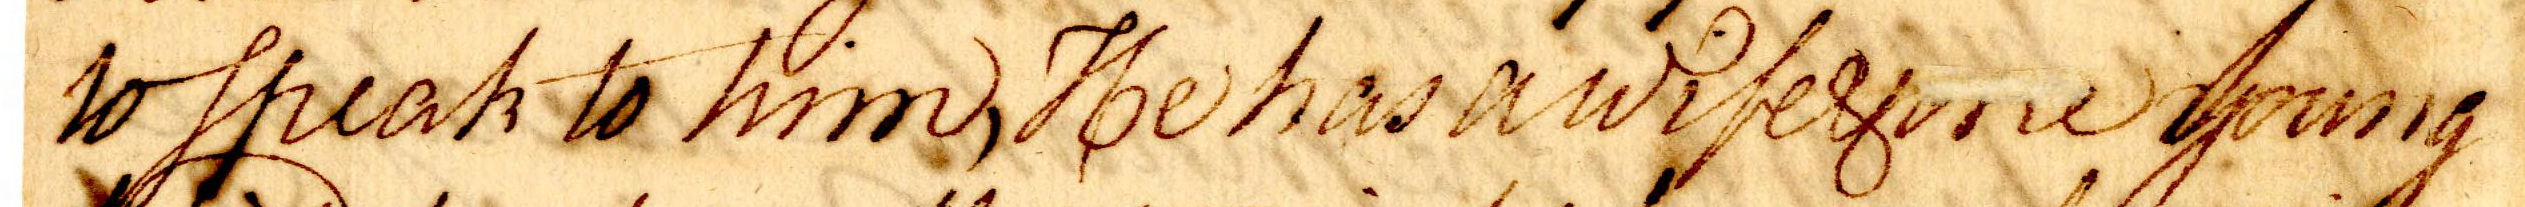to speak to him, He has a wife & one Young
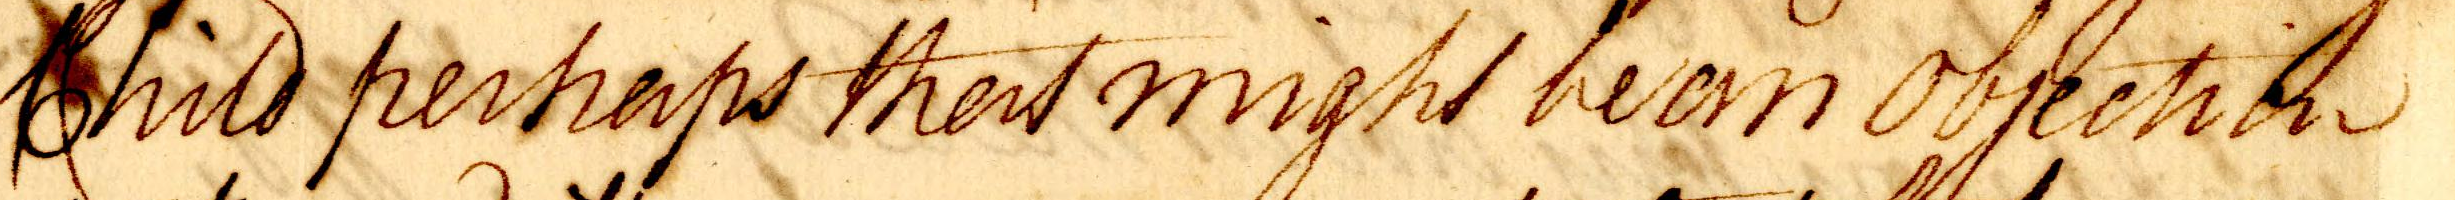Child perhaps that might be an objection
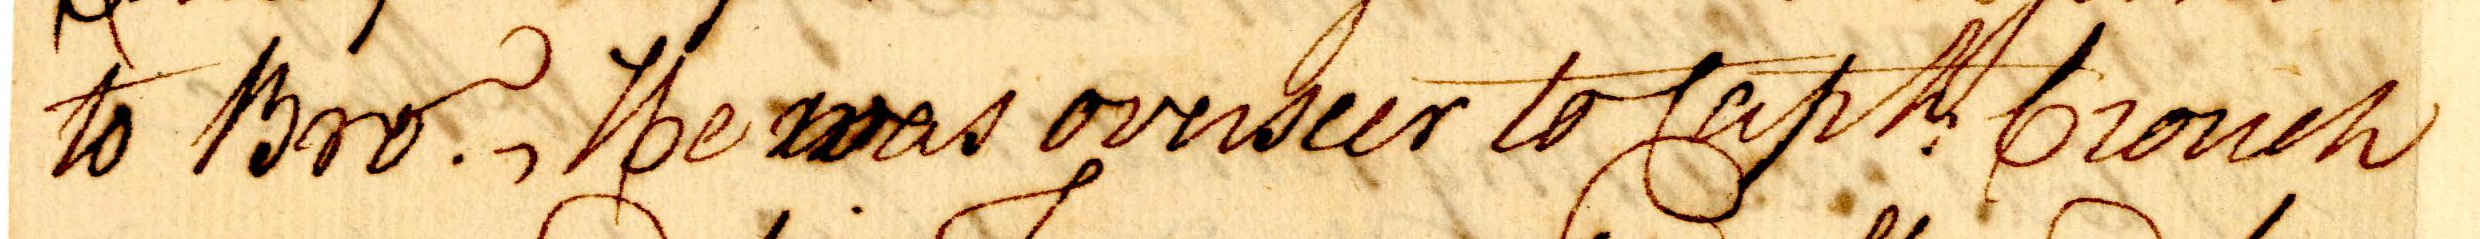to Bro.- He was overseer to Capt. Crouch
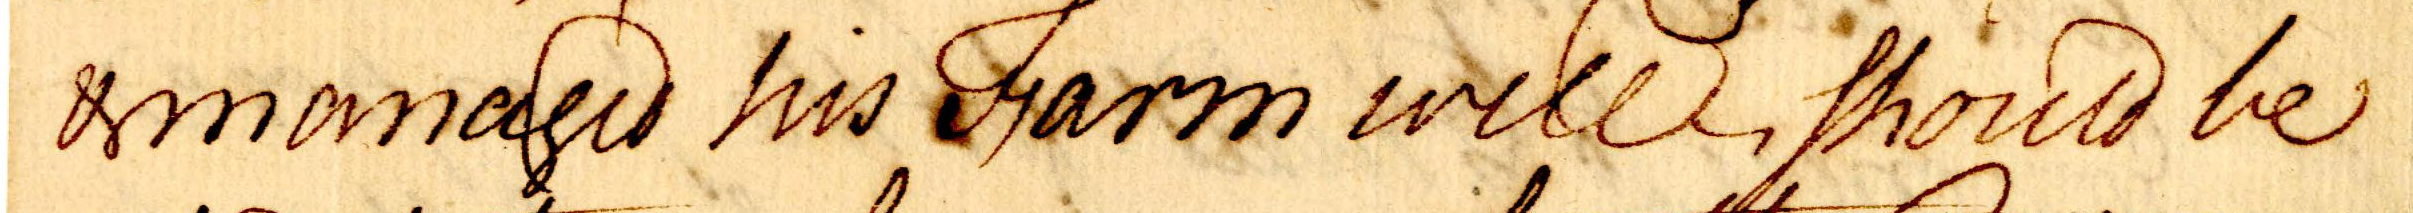& managed his Farm well, should be
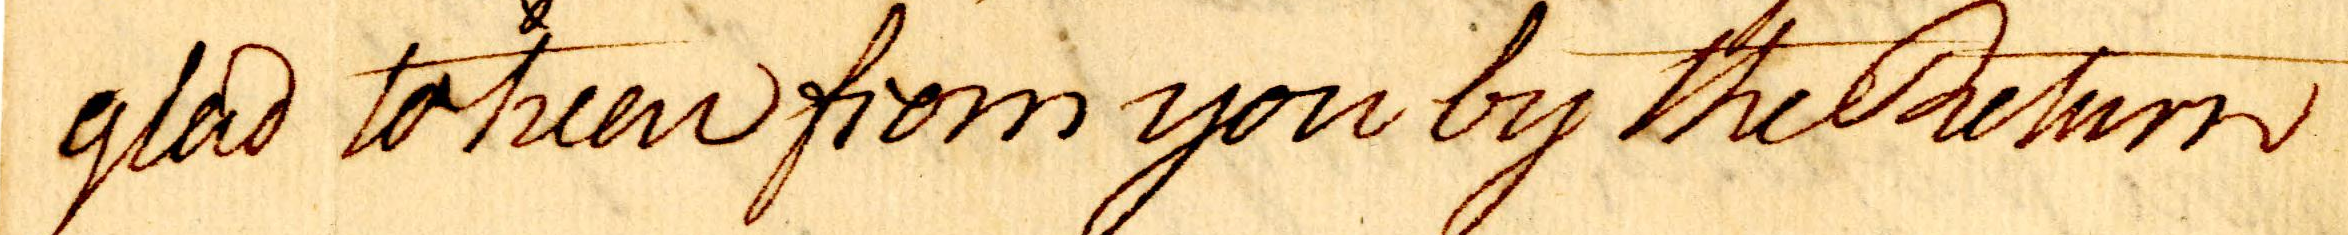glad to hear from you by the Return
